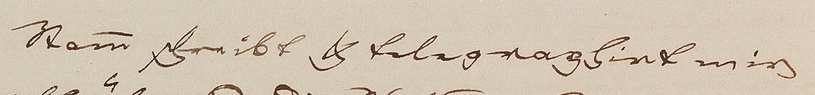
Stamm schreibt & telegraphirt mir
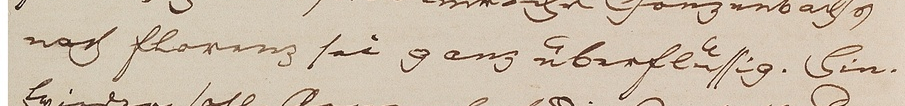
nach Florenz sei ganz überflüssig. Hin-
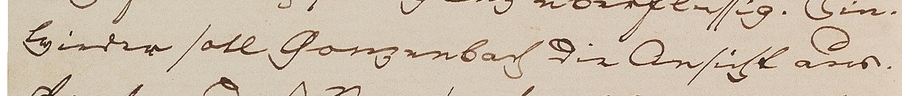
wieder soll Gonzenbach die Ansicht aus-
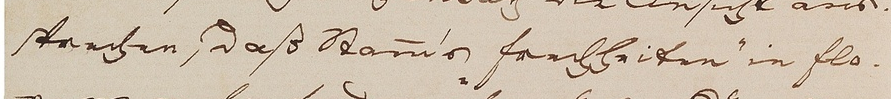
sprechen, daß Stamm's «Frechheiten» in Flo-
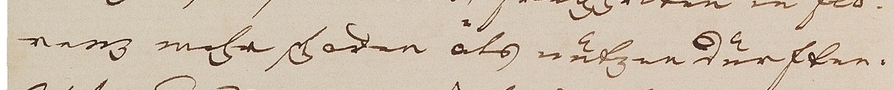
renz mehr schaden als nützen dürften.
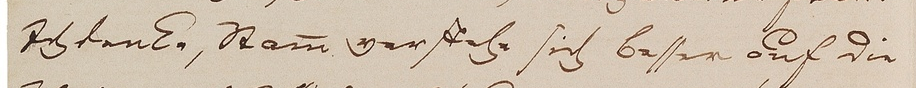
Ich denke, Stamm verstehe sich besser auf die
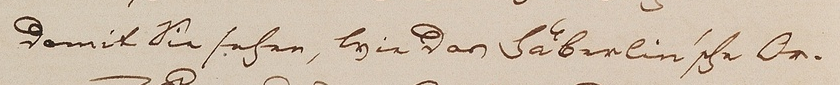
Damit Sie sehen, wie das Häberlin'sche Or-
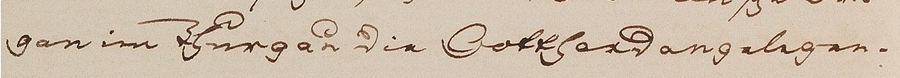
gan im Thurgau die Gotthardangelegen-
